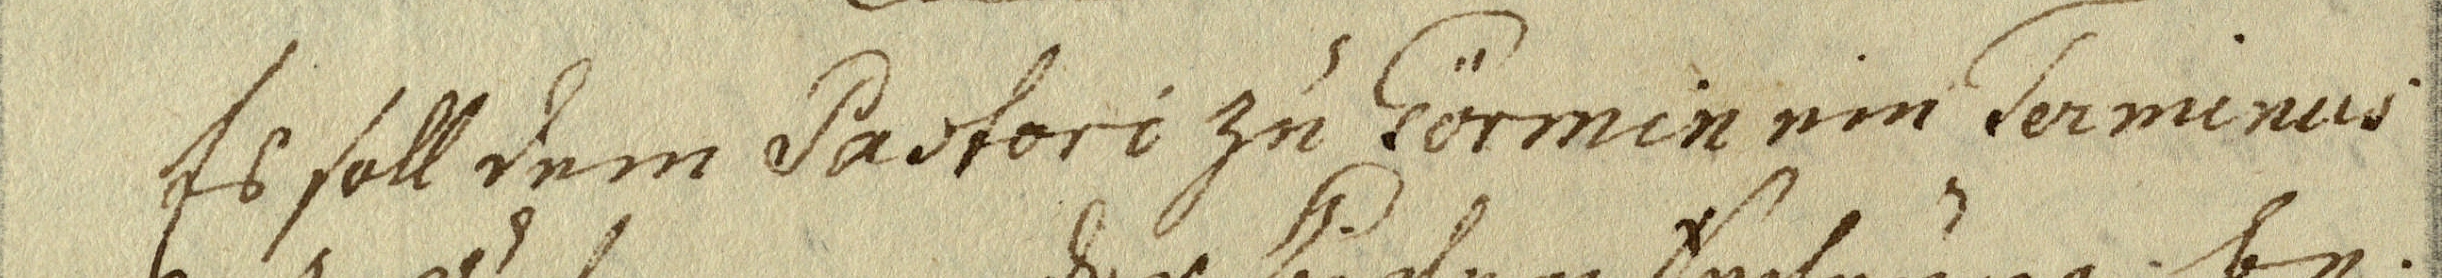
Es soll dem Pastori zu Görmin ein Terminus
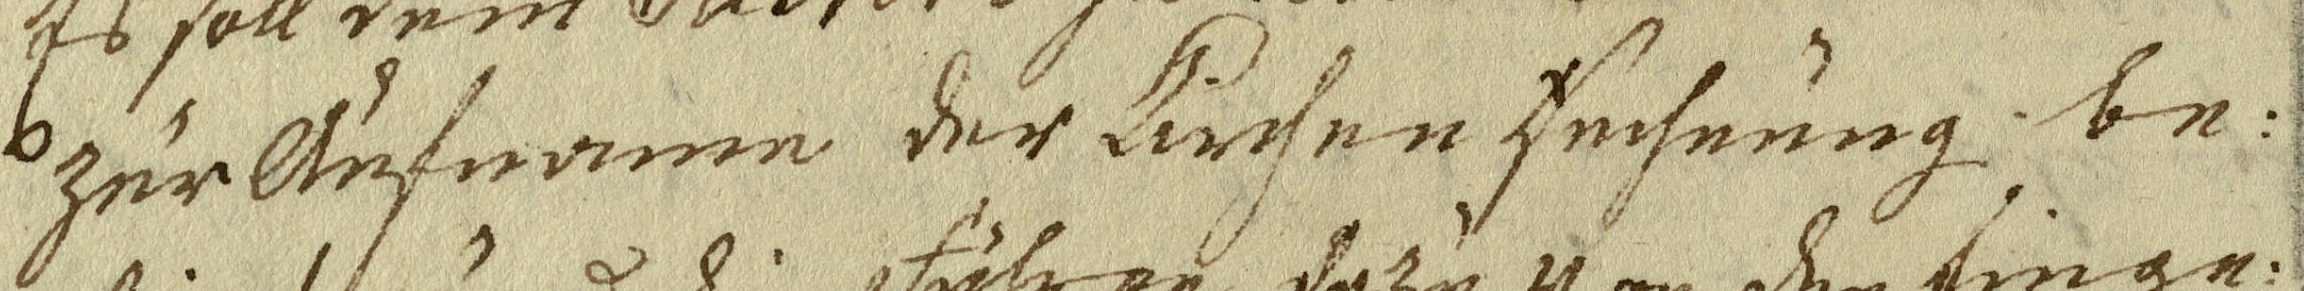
zur Aufname der Kirchen Rechnung be¬
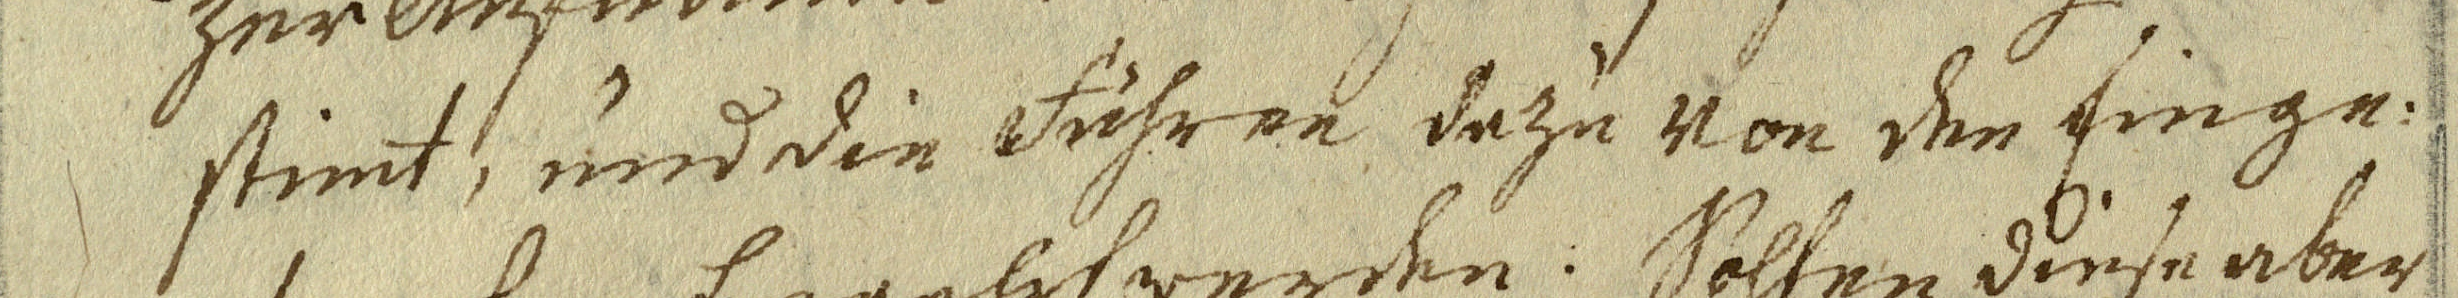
stimt, und die Fuhren dazu von den Einge¬
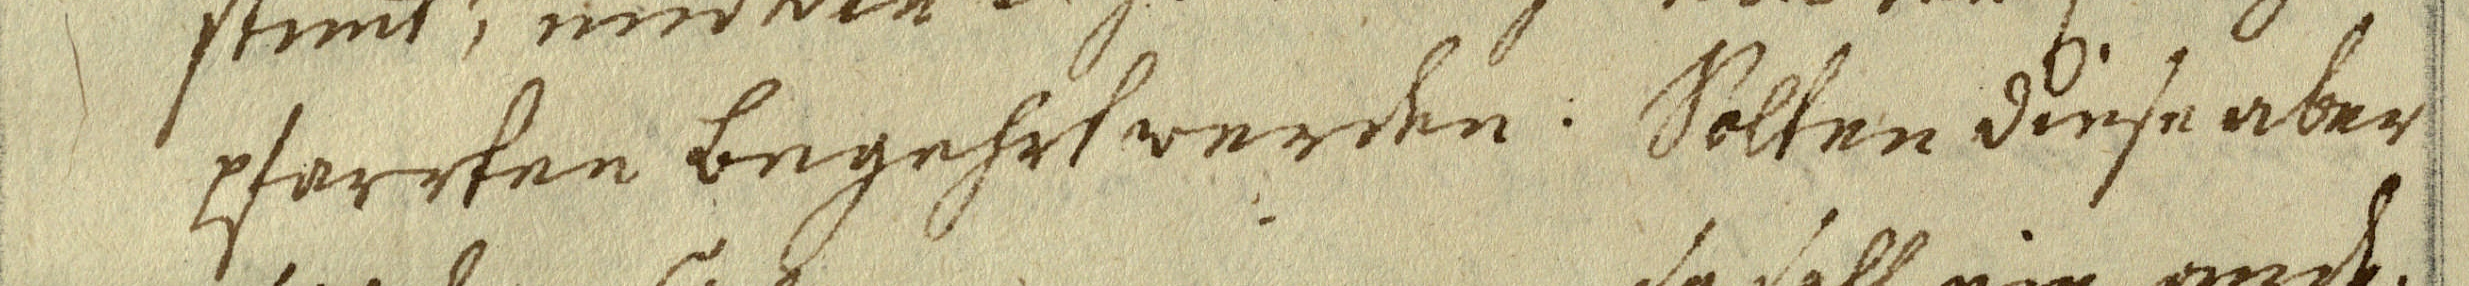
pfarrten begehrt werden. Solten diese aber
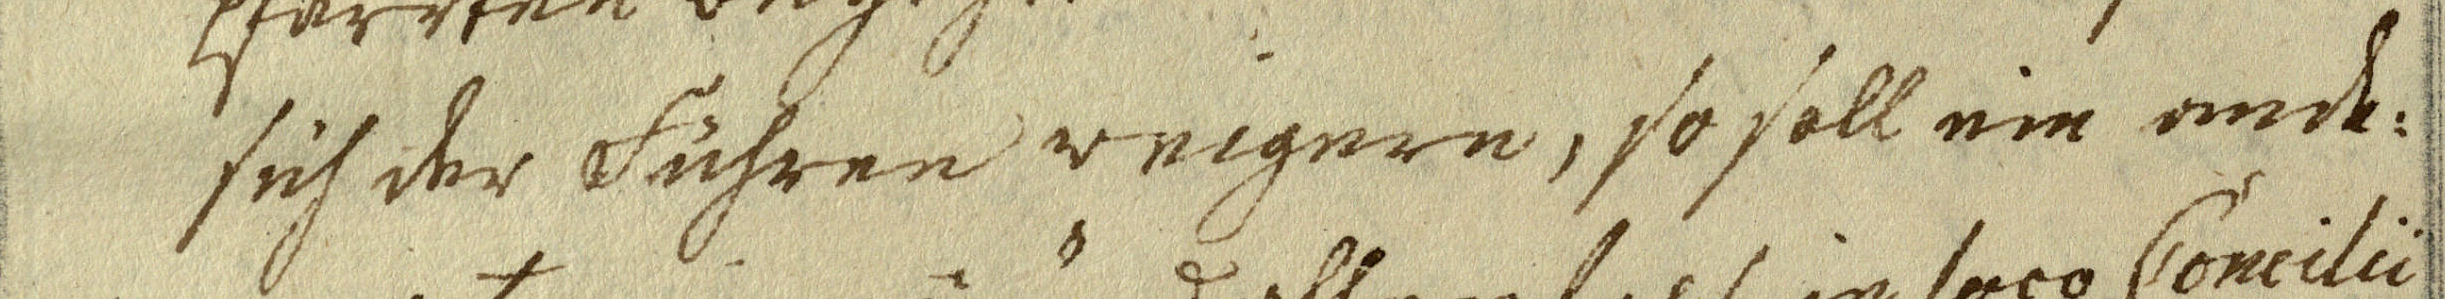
sich der Fuhren weigern, so soll ein ande¬
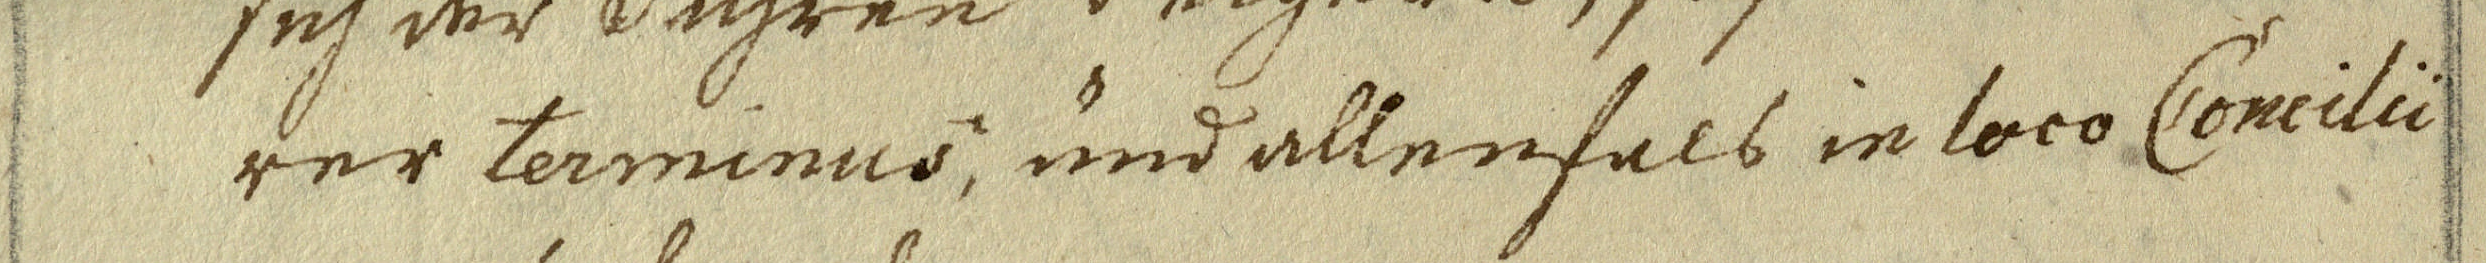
rer terminus, und allenfals in loco Concilii
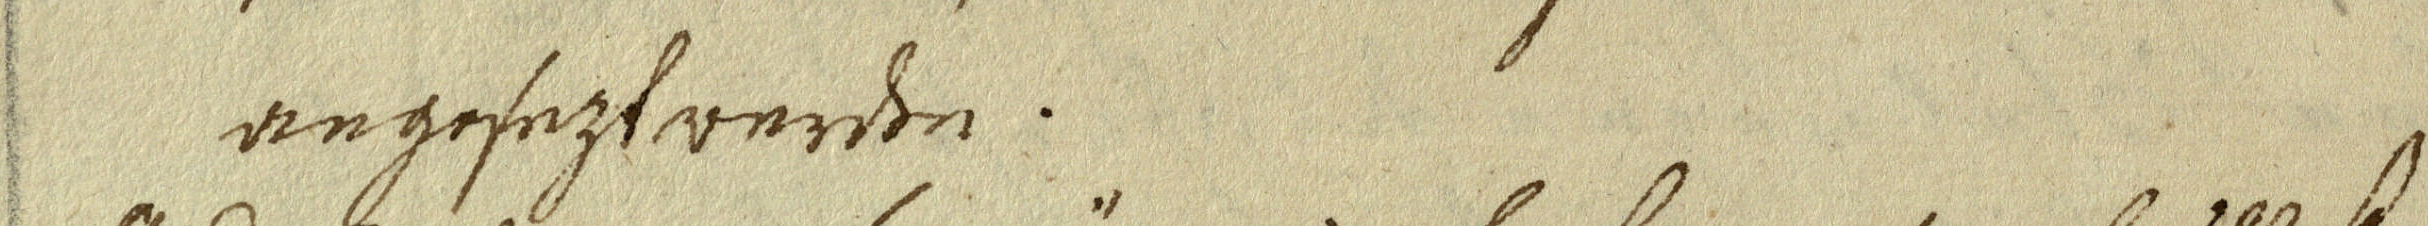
angesezt werden.
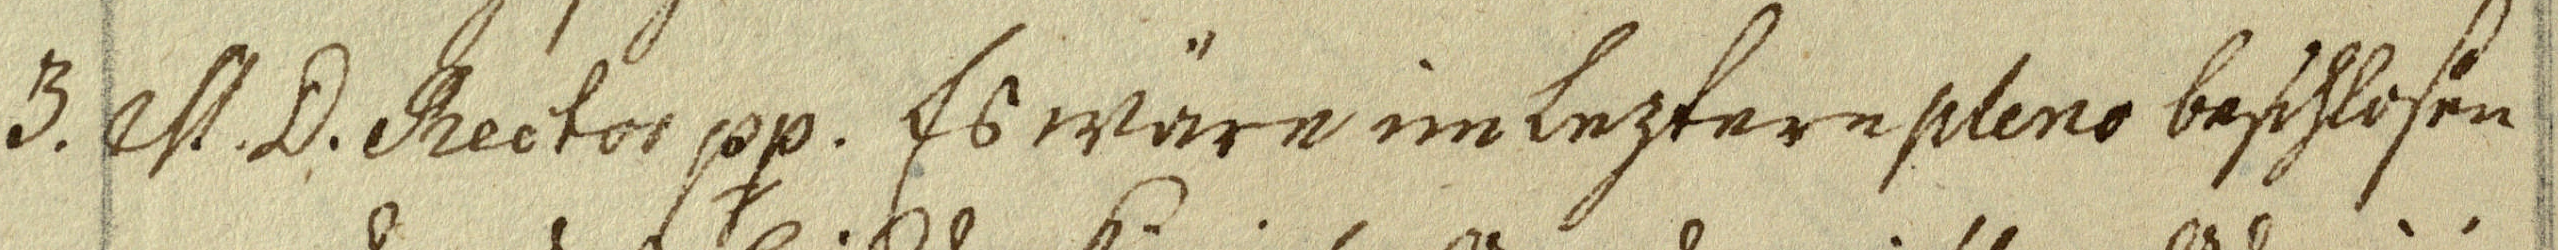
3. M. D. Rector pp. Es wäre im leztern pleno beschloßen
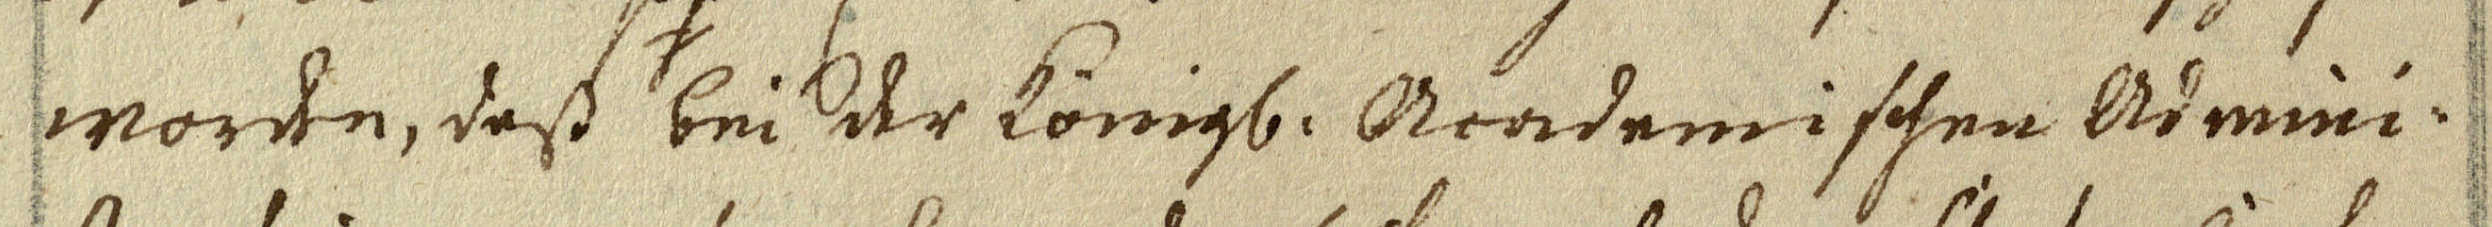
worden, daß bei der Königl. Academischen Admini¬
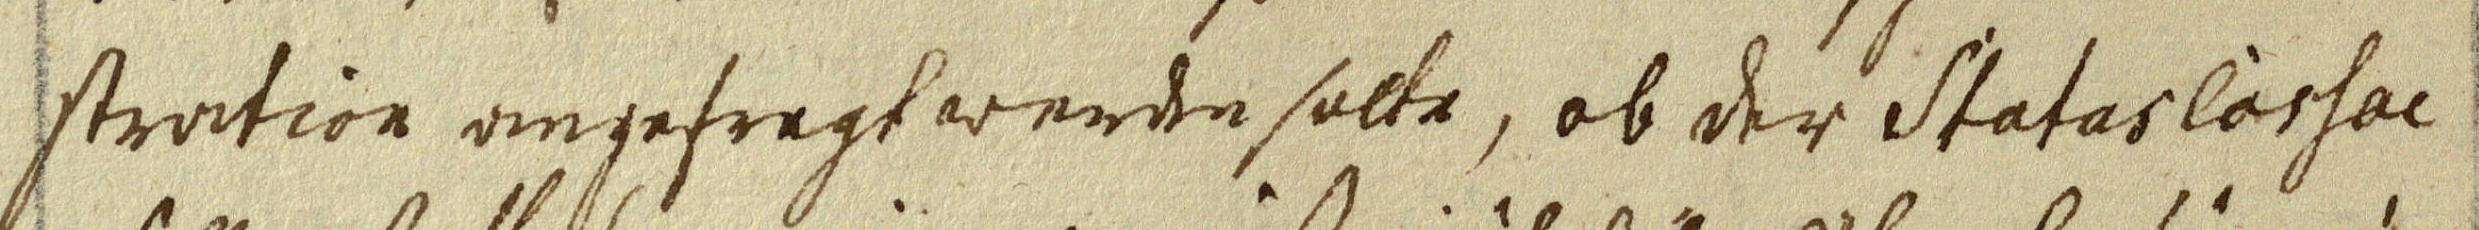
stration angefragt werden solte, ob der Status Cassae
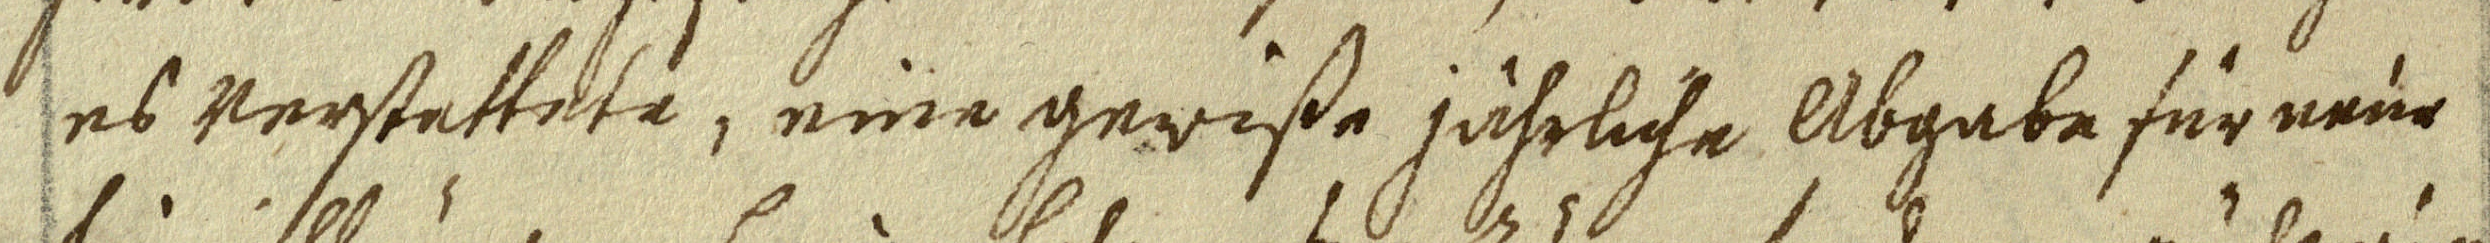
es verstattete, eine gewiße jährliche Abgabe für neue
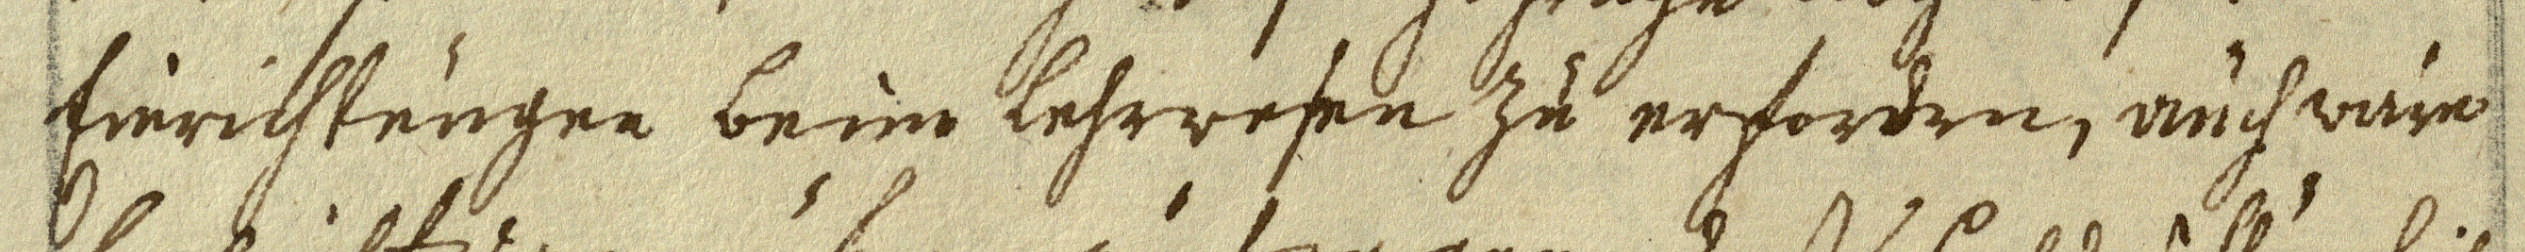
Einrichtungen beim Lehrwesen zu erfordern, auch wäre
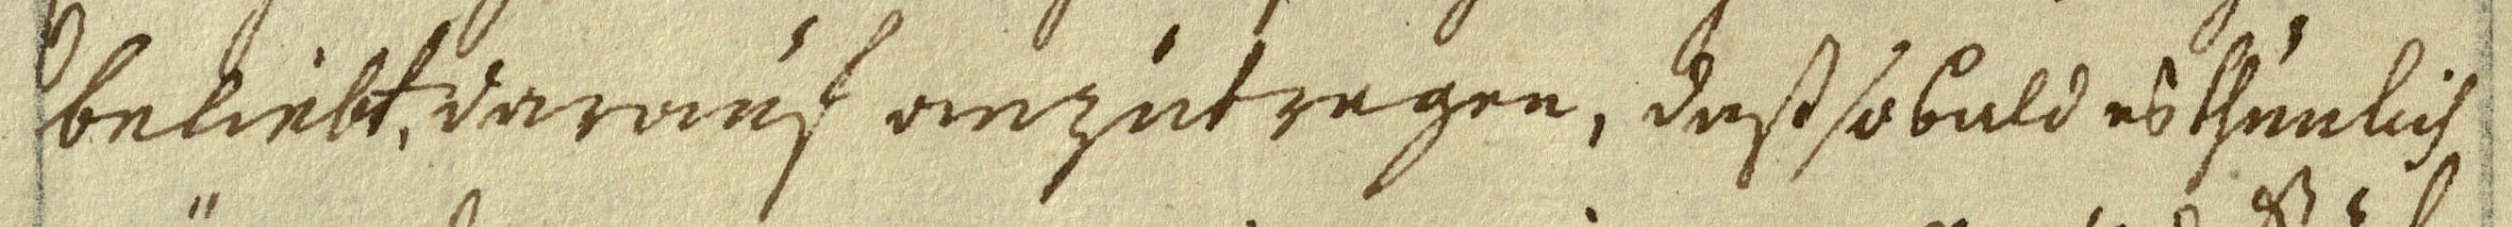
beliebt, darauf anzutragen, daß sobald es thunlich
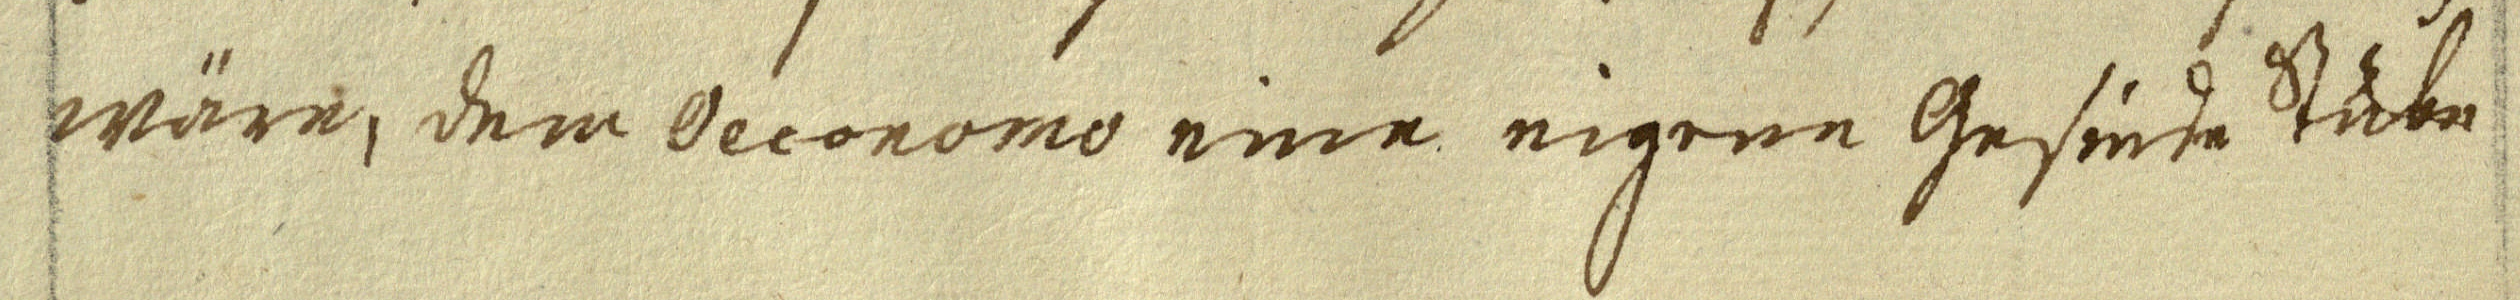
wäre, dem Oeconomo eine eigene Gesinde Stube
